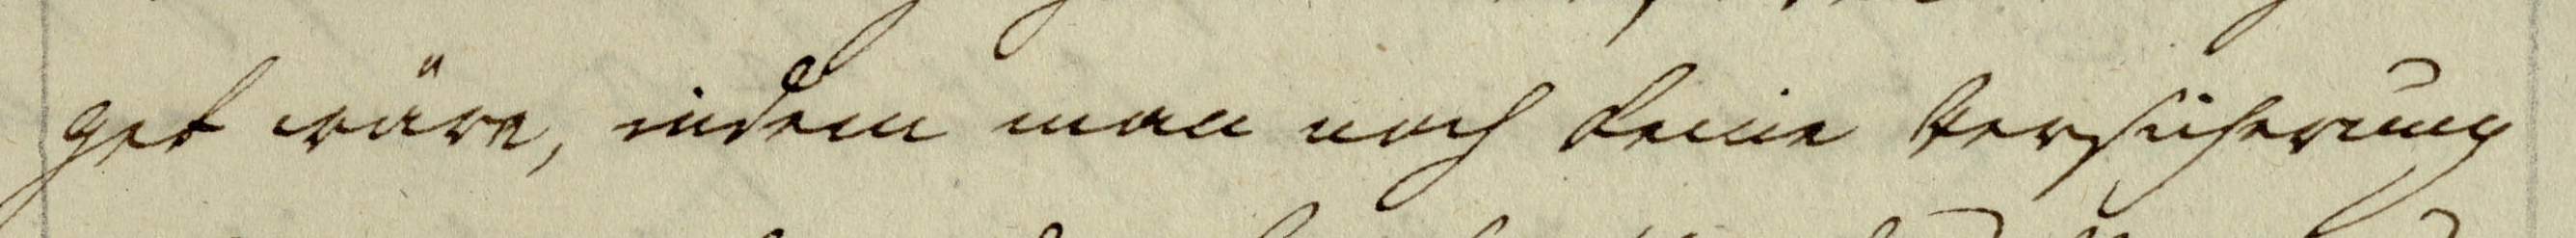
get wäre, indem man noch keine Versicherung
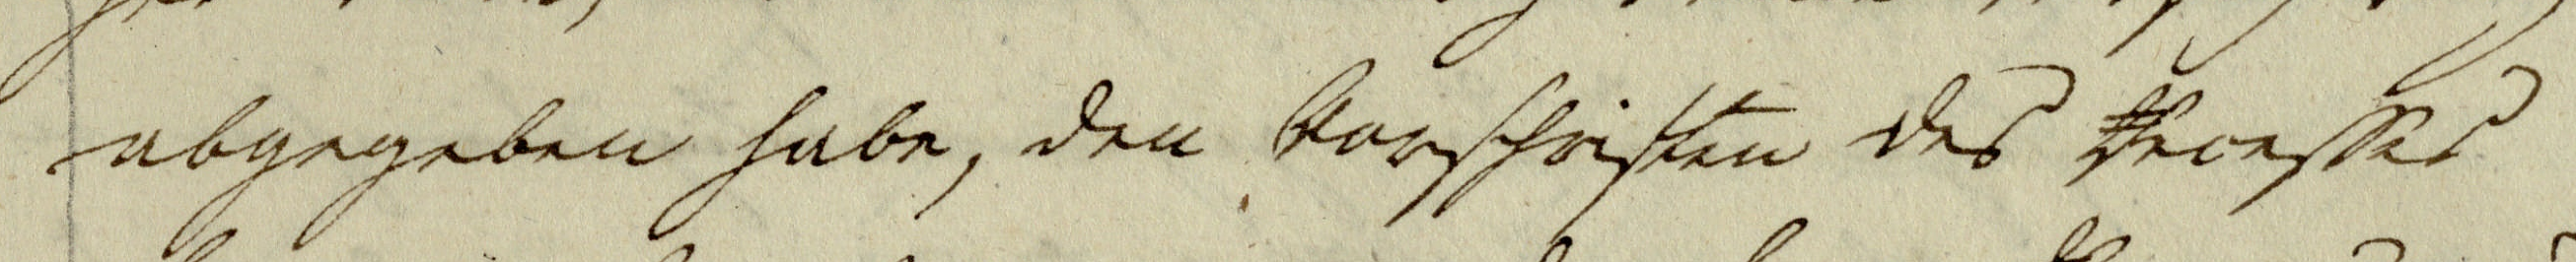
abgegeben habe, den Vorschriften des Recesses
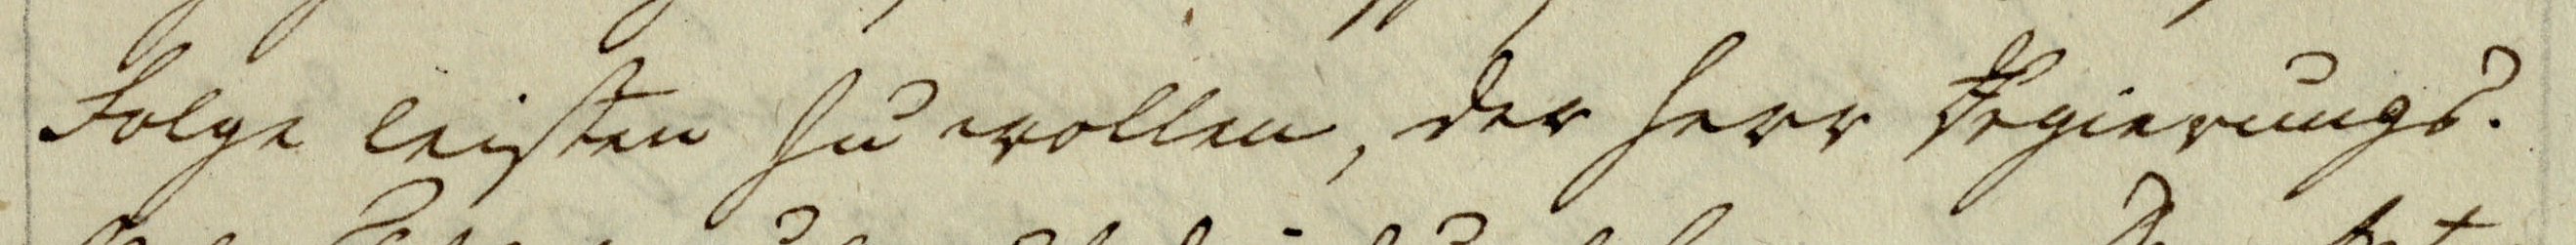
Folge leisten zu wollen, der Herr Regierungs¬
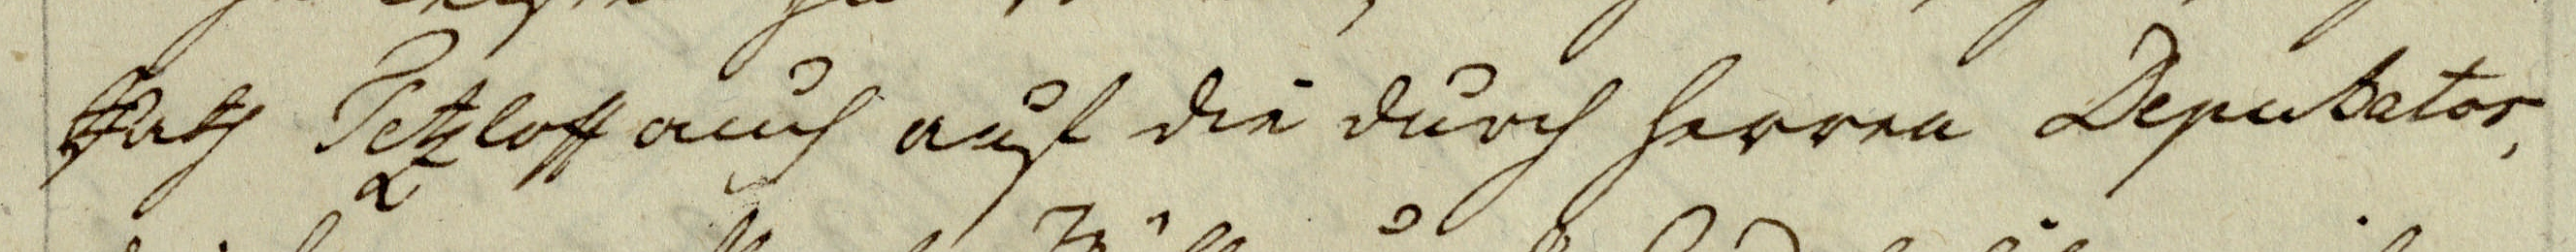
Rath Tetzloff auch auf die durch Herren Deputatos,
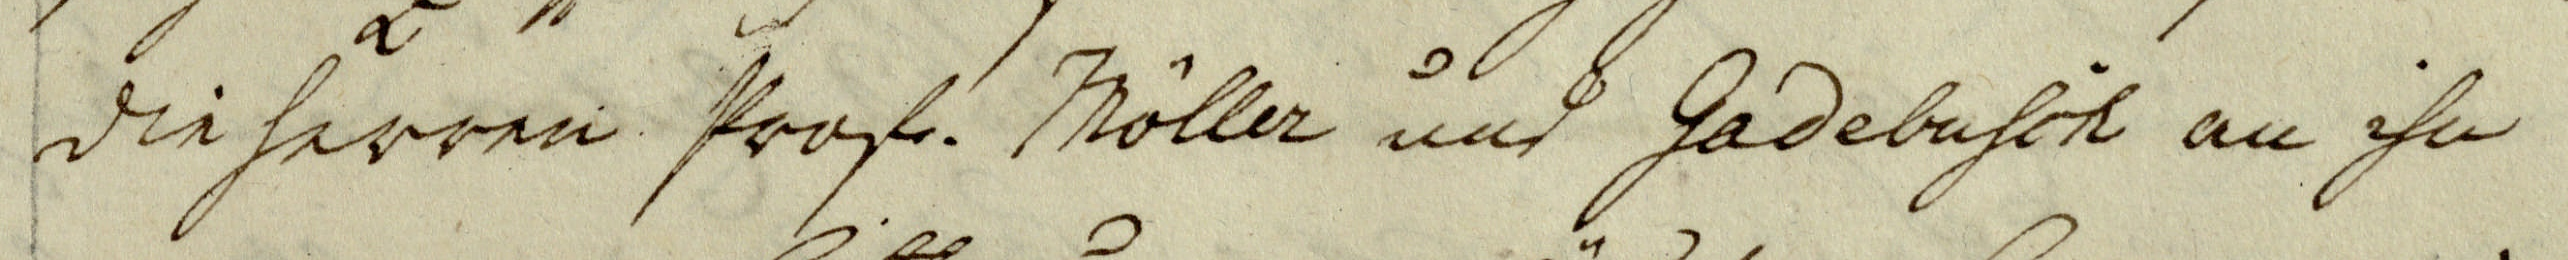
die Herren Prof. Möller und Gadebusch an ihn
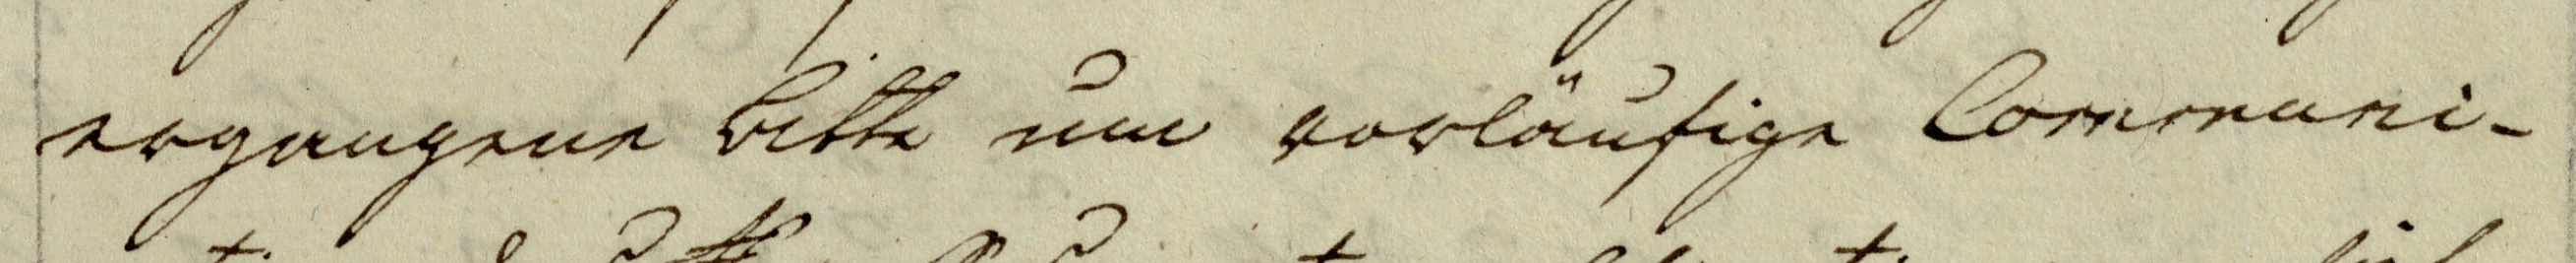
ergangene Bitte um vorläufige Communi¬
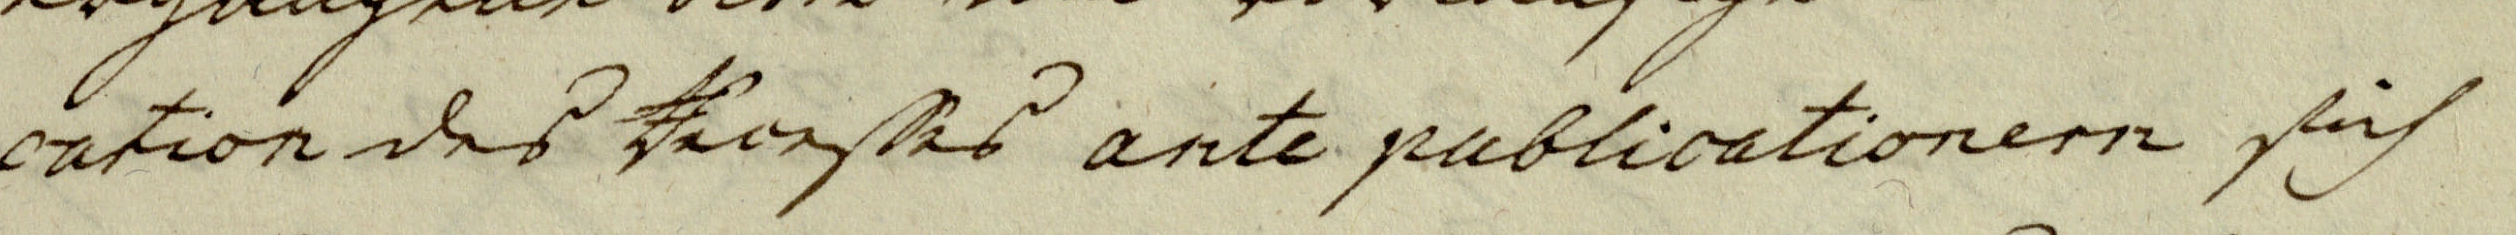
cation des Recesses ante publicationem sich
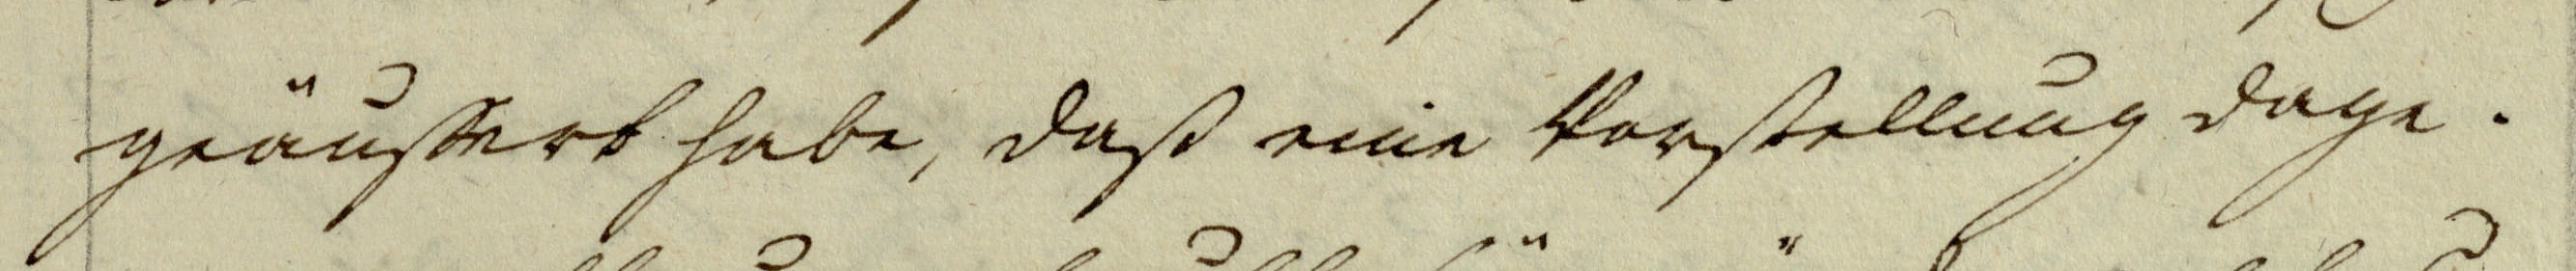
geäussert habe, daß eine Vorstellung dage¬
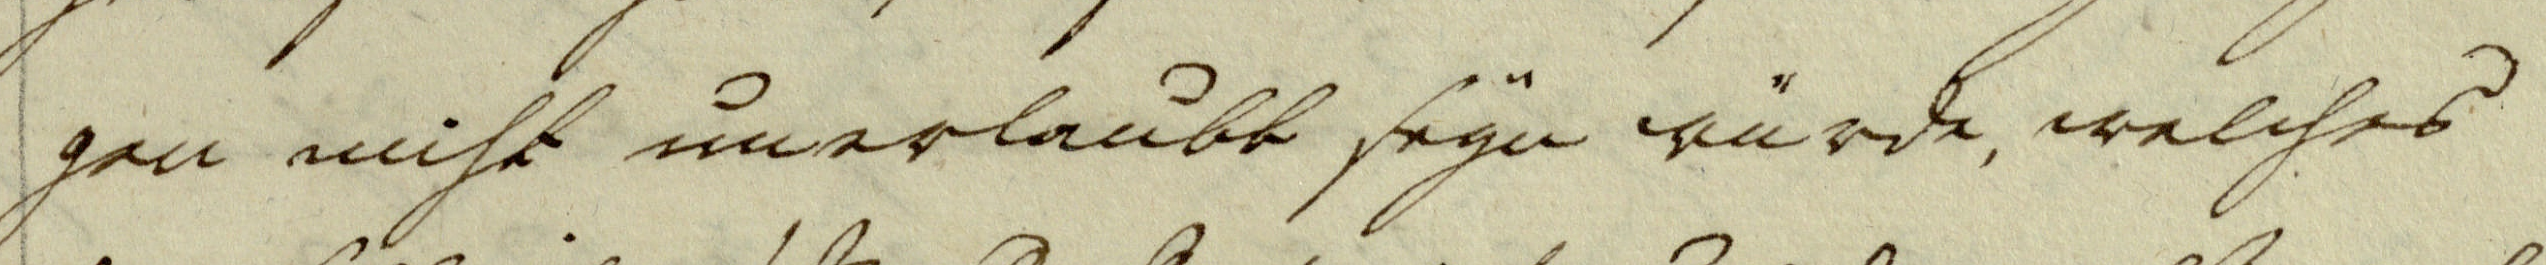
gen nicht unerlaubt seÿn würde, welches
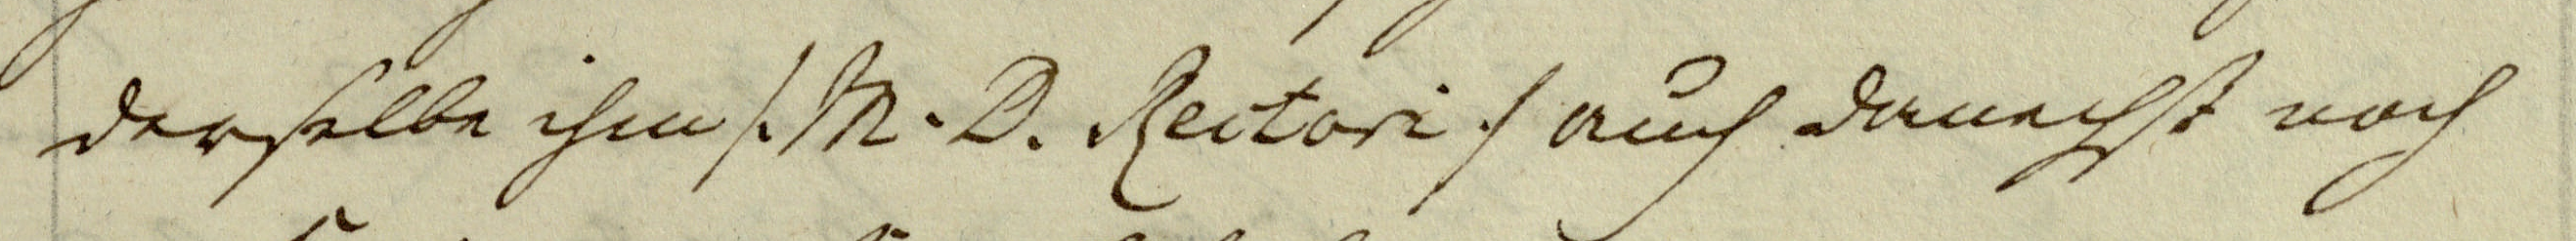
derselbe ihm /. M. D. Rectori ./ auch danechst noch
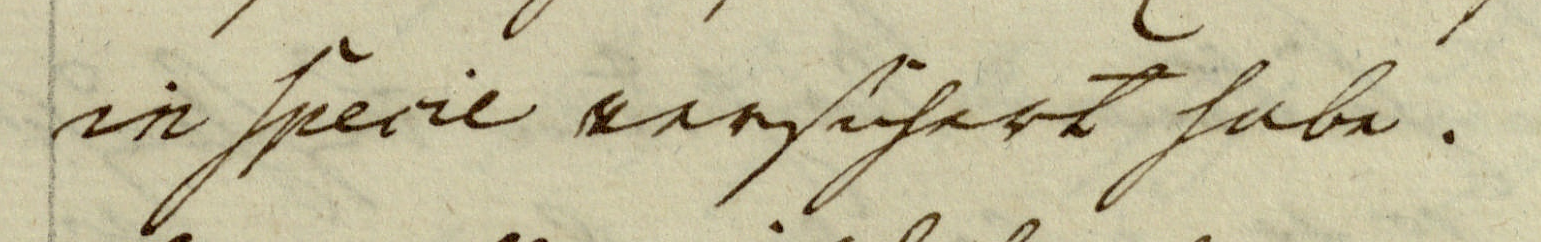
in specie versichert habe.
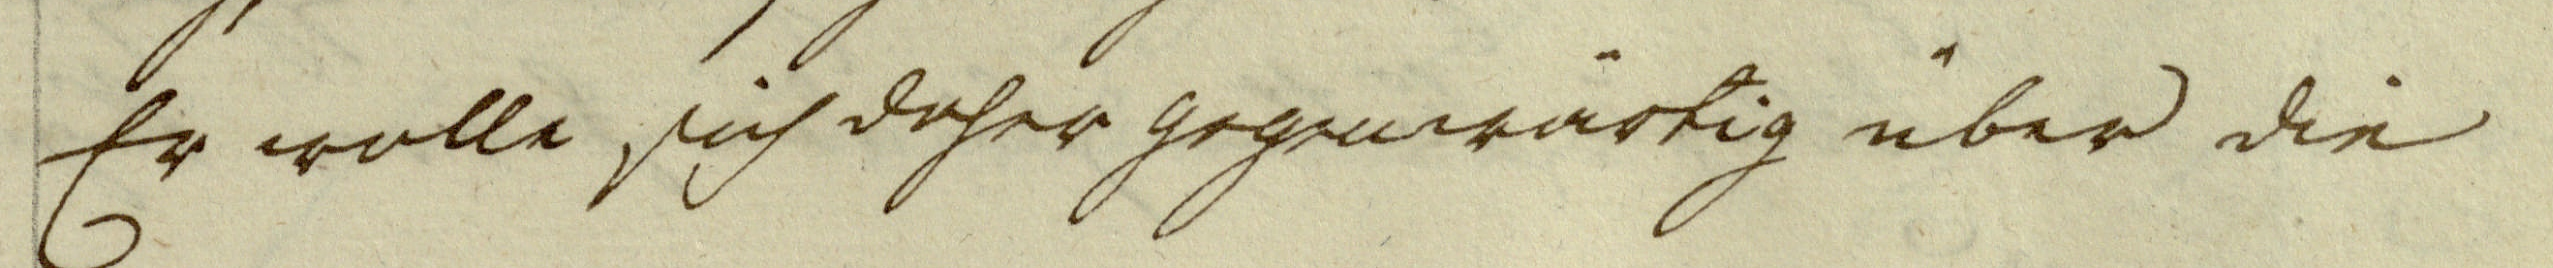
Er wolle sich daher gegenwärtig über die
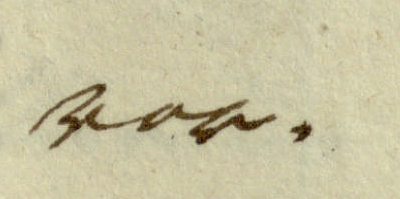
vor¬
